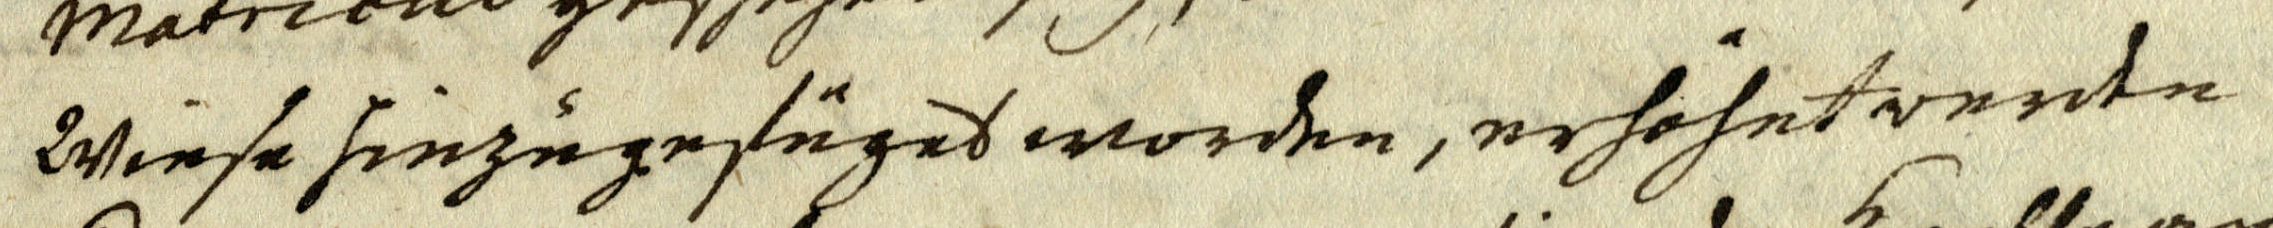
Wiese hinzugefüget worden, erhöhet werden
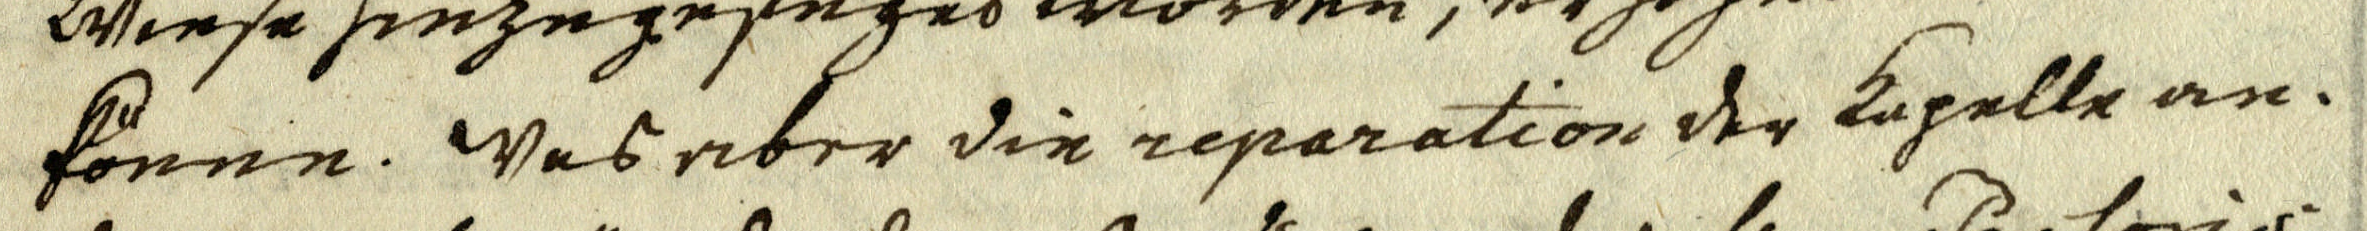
könne. Was aber die reparation der Kapelle an¬
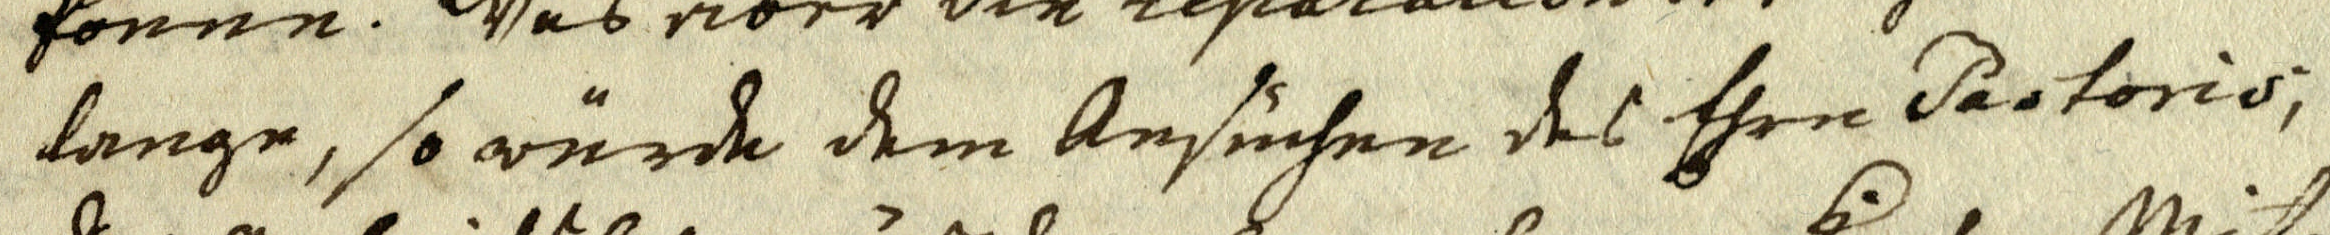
lange, so würde dem Ansuchen des Ehrn Pastoris,
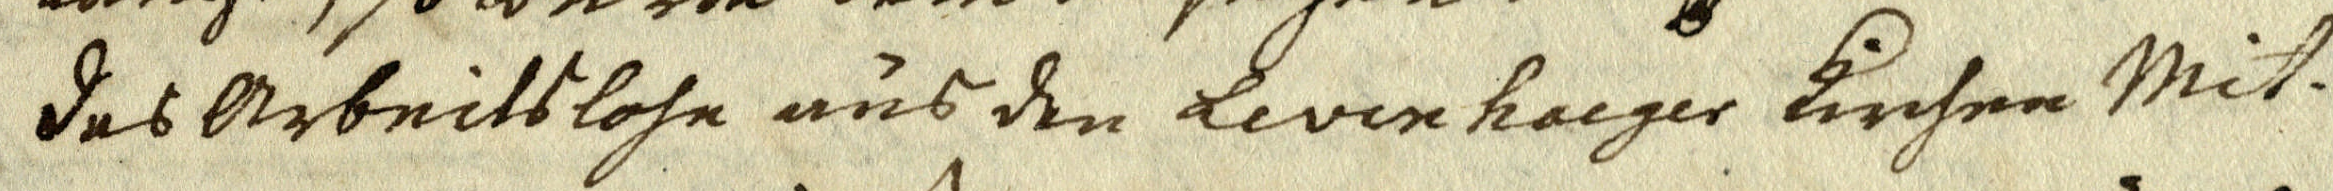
das Arbeitslohn aus den Levenhaeger Kirchen Mit¬
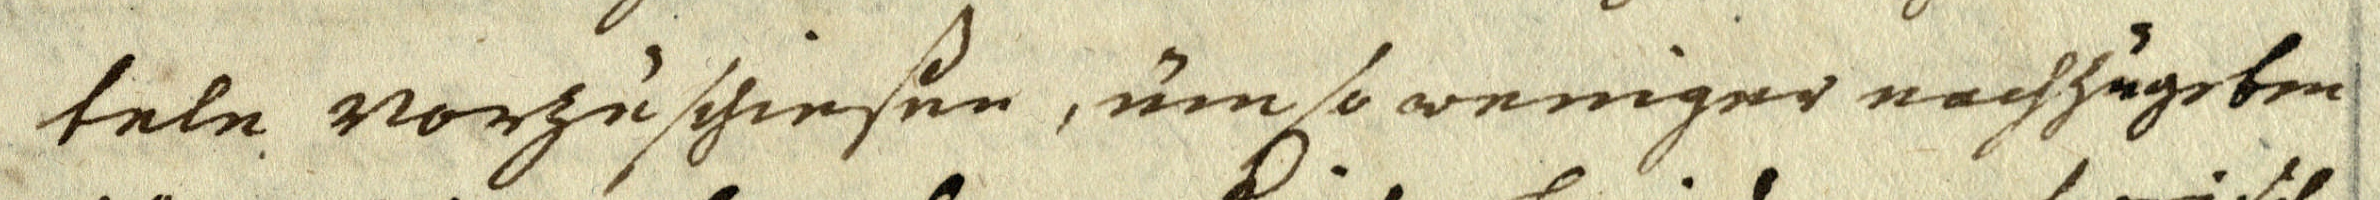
teln vorzuschießen, um so weniger nachzugeben
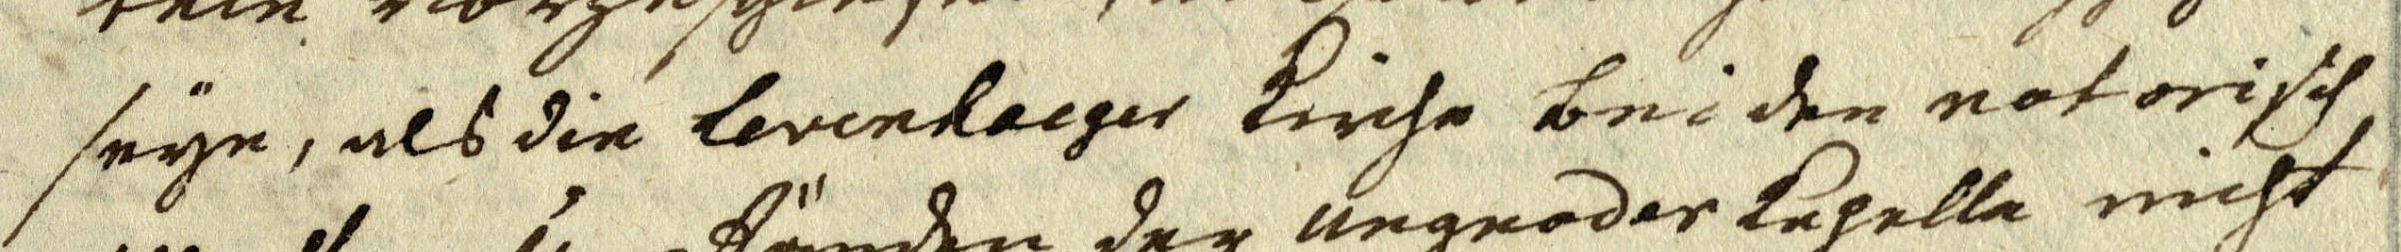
seÿn, als die Levenhaeger Kirche bei den notorisch
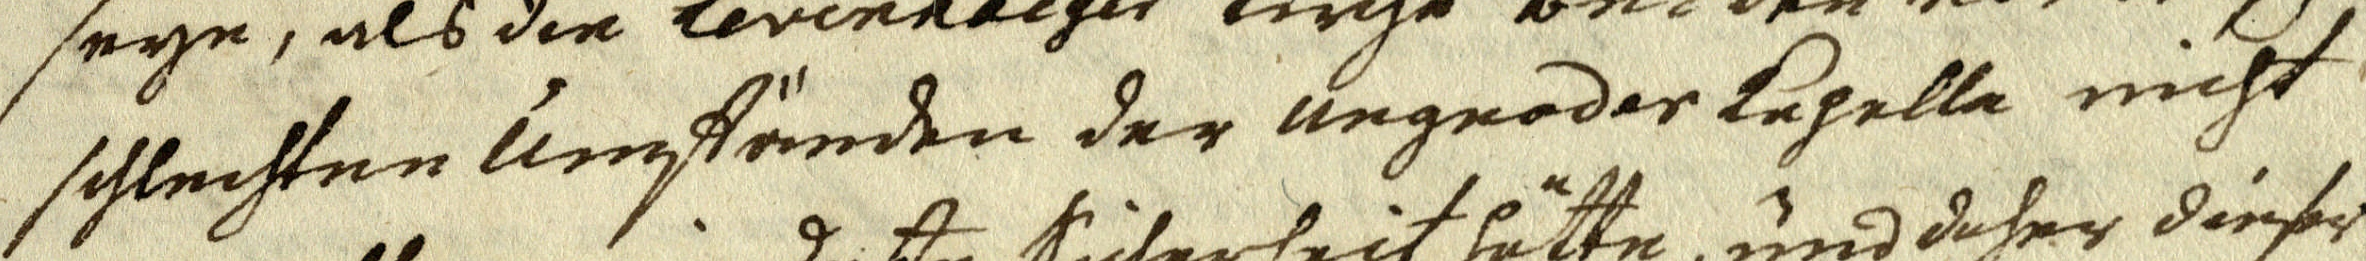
schlechten Umständen der Ungnader Kapelle nicht
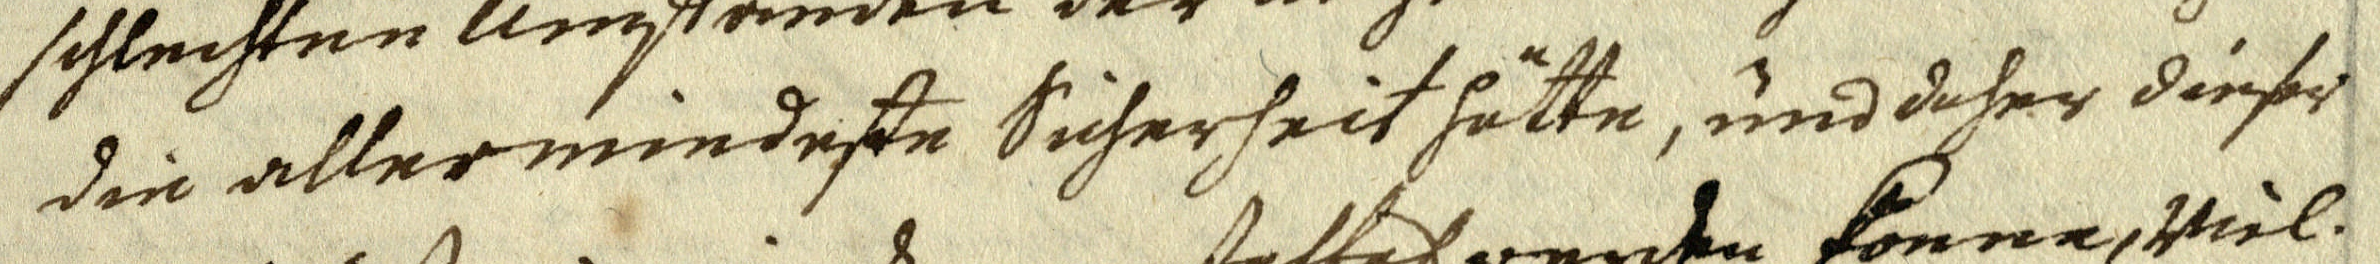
die allerminderste Sicherheit hätte, und daher dieser
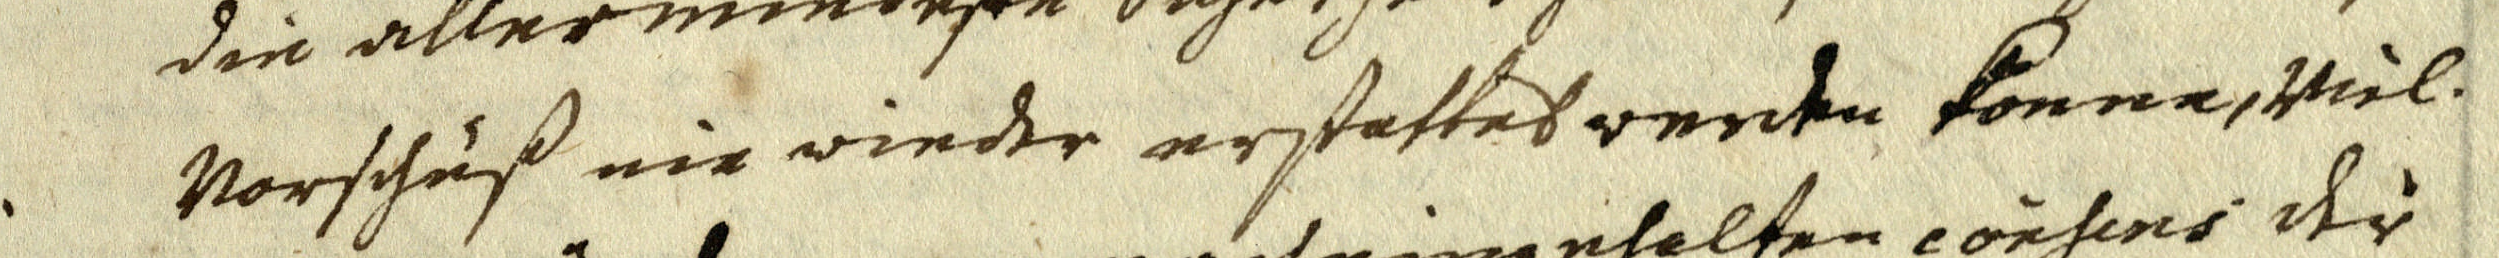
Vorschuß nie wieder erstattet werden könne, viel¬
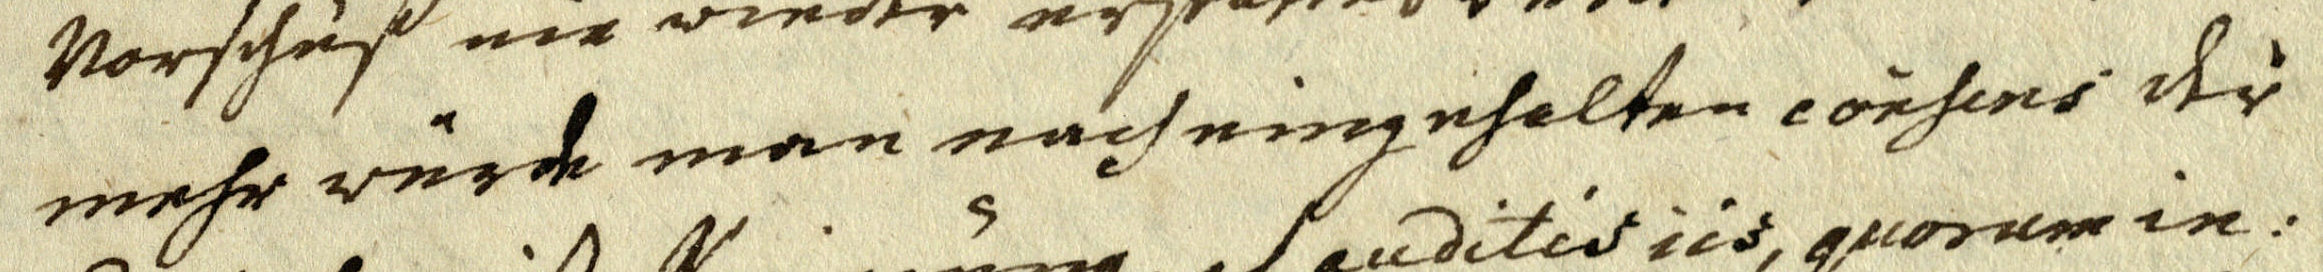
mehr würde man nach eingeholten consens der
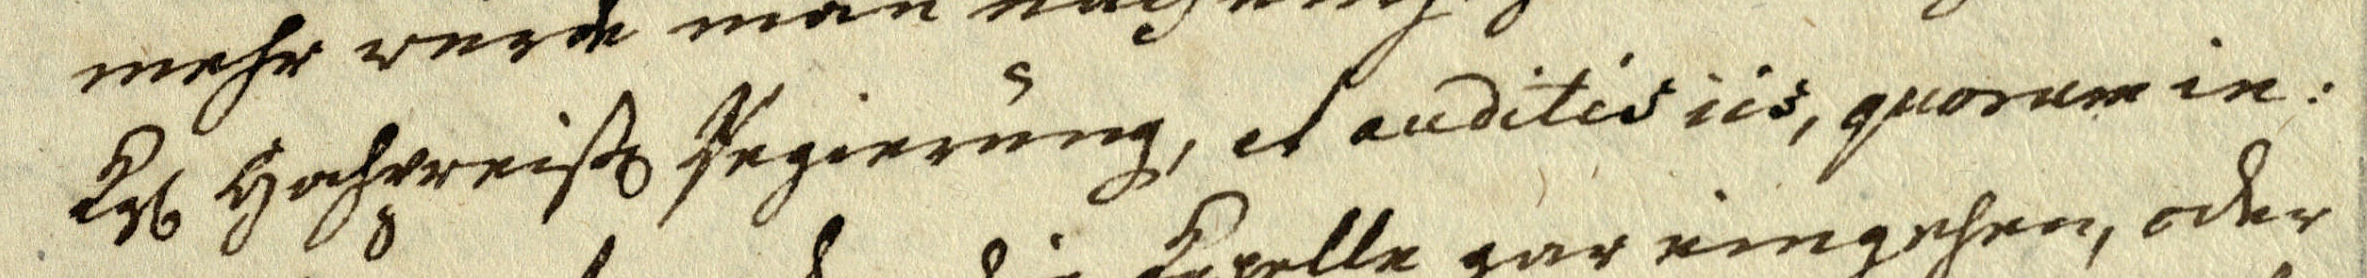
Kgl. Hochpreißl. Regierung, et auditis iis quorum in¬
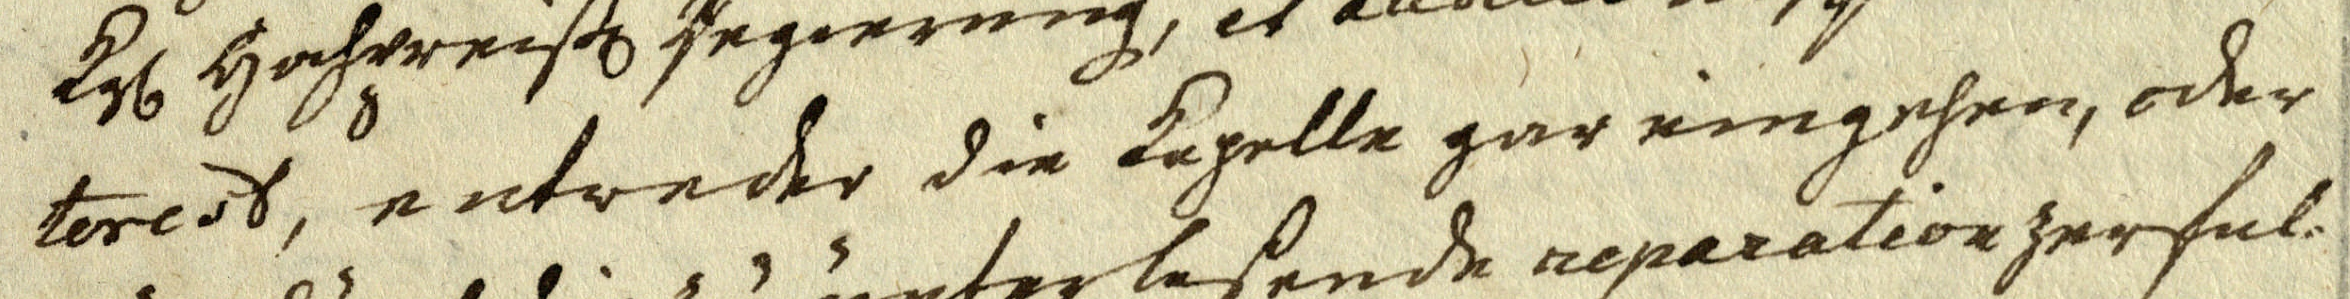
teress, entweder die Kapelle gar eingehen, oder
